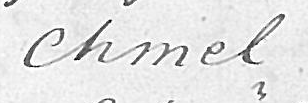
Chmel
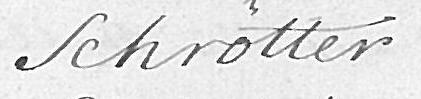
Schrötter
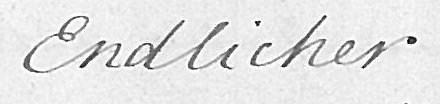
Endlicher
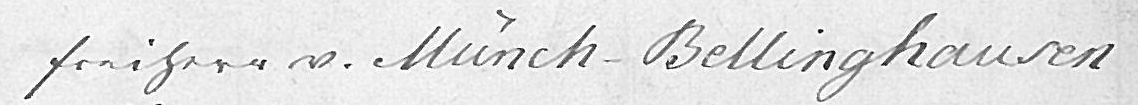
Freiherr v. Münch Bellinghausen
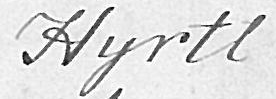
Hyrtl
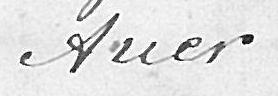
Auer
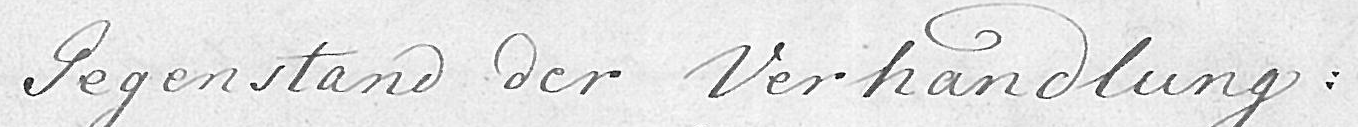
Gegenstand der Verhandlung:
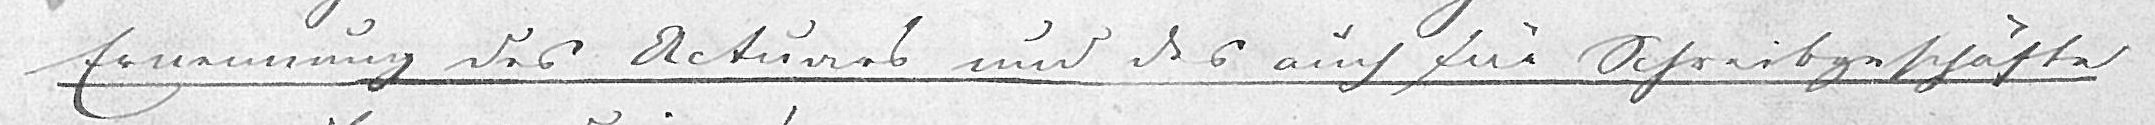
Ernennung des Actuars und des auch für Schreibgeschäfte
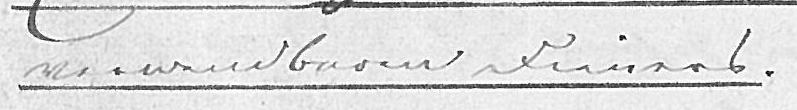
verwendbaren Dieners.
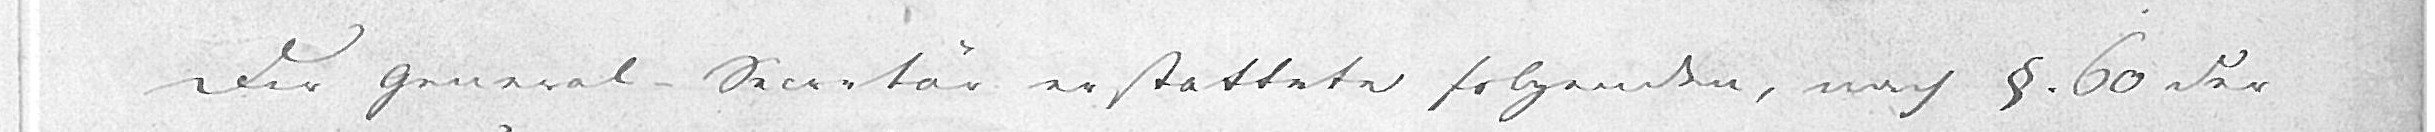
Der General-Secretär erstattete folgenden, nach §. 60 der
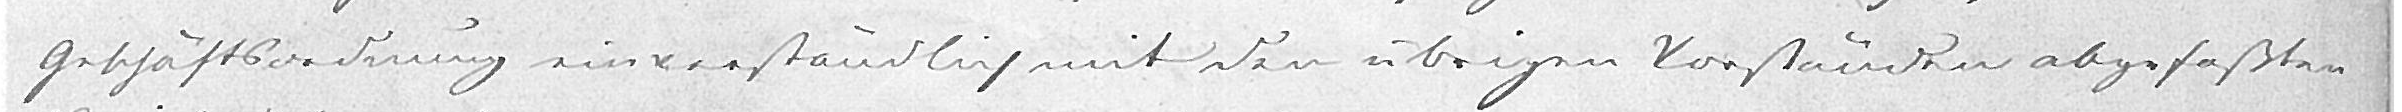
Geschäftsordnung einverständlich mit den übrigen Vorständen abgefaßten
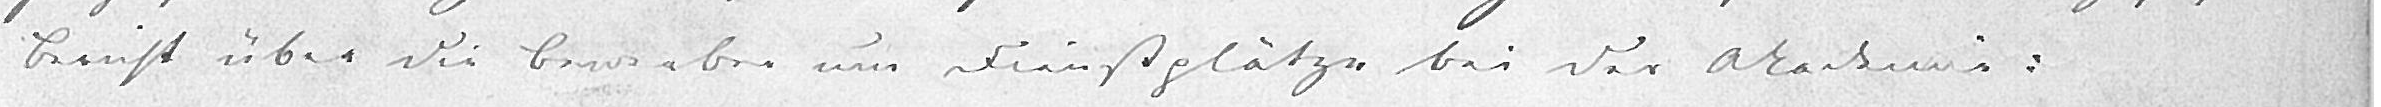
Bericht über die bewerber und Dienstplätze bei der Akademie
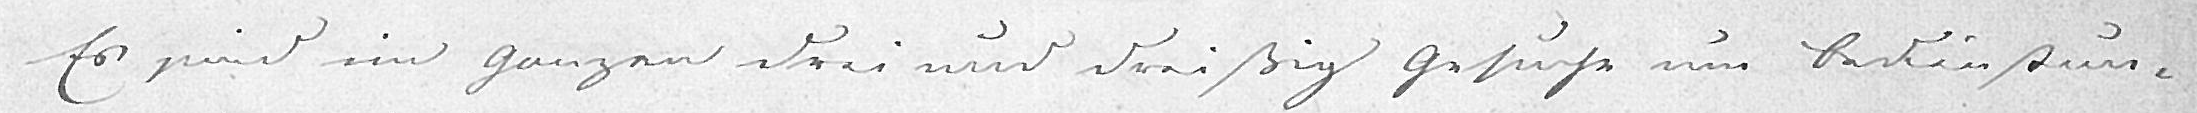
Es sind im Ganzen drei und dreißig Gesuche um Bedienstun-
